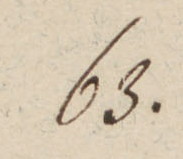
63.
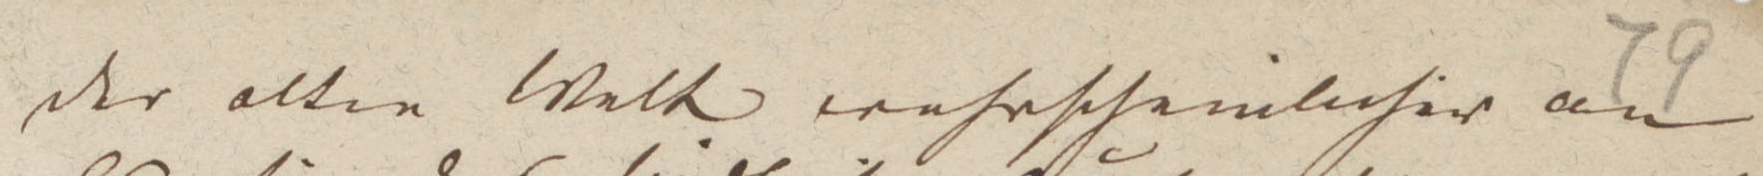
der alten Welt wahrscheinlicher an
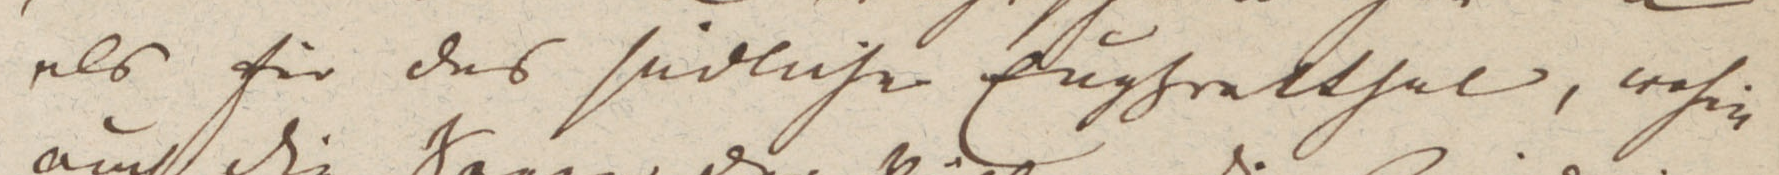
als für das südliche Euphratthal, wohin
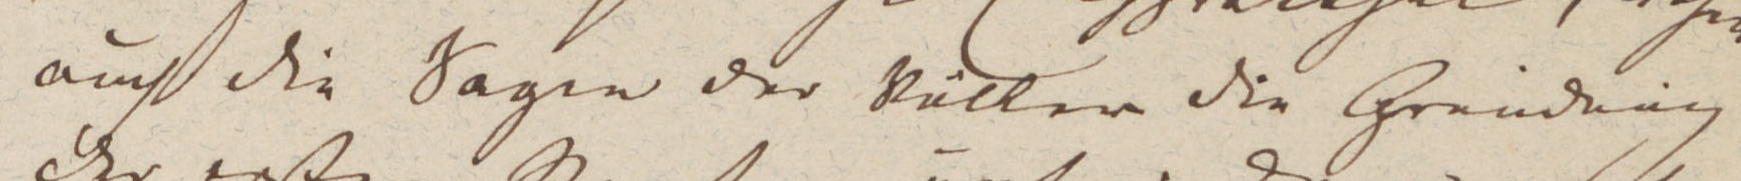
auch die Sagen der Völker die Gründung
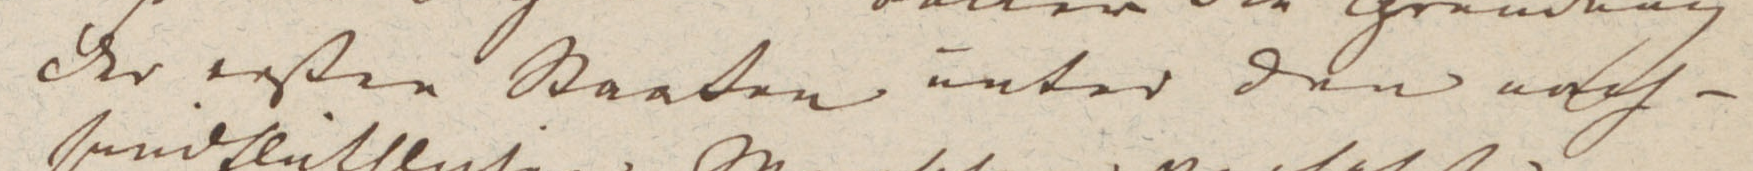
der ersten Staaten unter den nach-
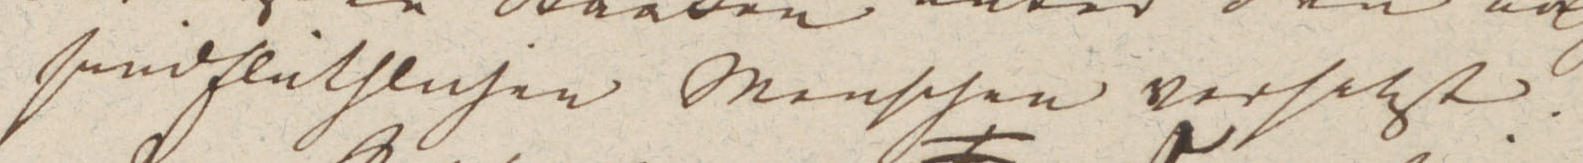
sündfluthlichen Menschen versetzt.
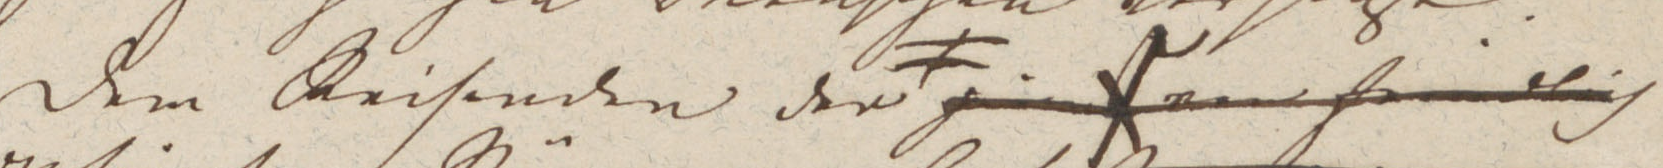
Dem Reisenden der jenes von feindlich %
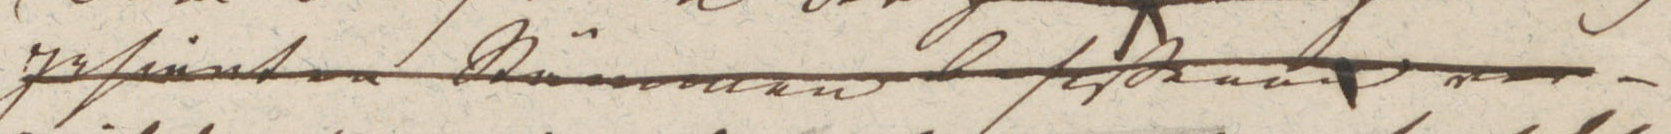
gesinnten Stämmen besessenen ver-
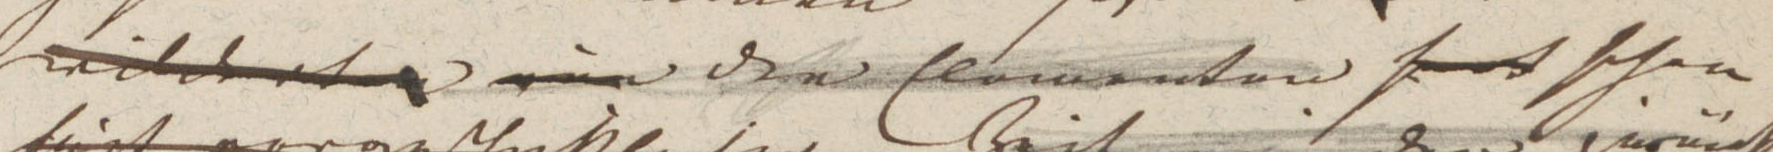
wilderten den Elementen seit schon
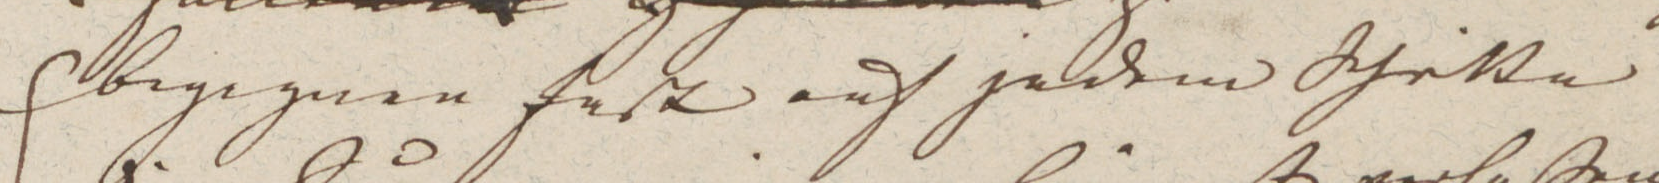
%begegnen fast auf jedem Schritte
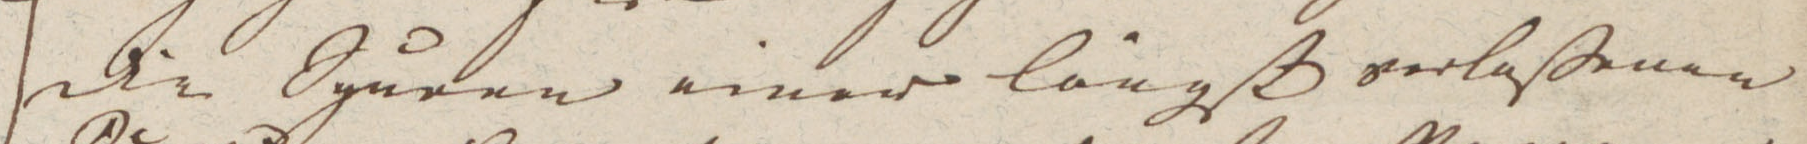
die Spuren einer längst verlassenen
